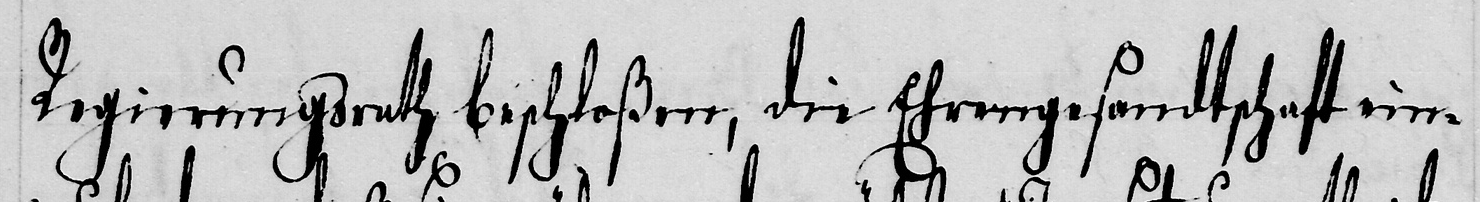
Regierungsrath beschloßen, die Ehrengesandtschaft ein¬
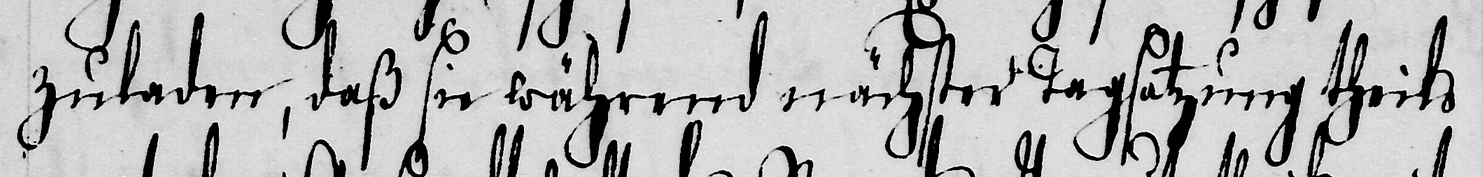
zuladen, daß sie während nächster Tagsatzung theils
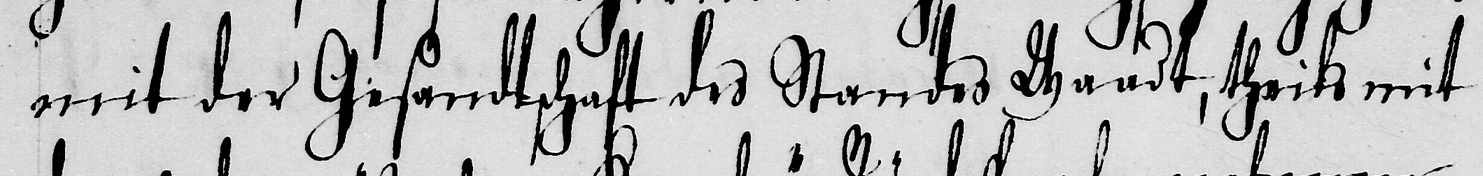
mit der Gesandtschaft des Standes Waadt, theils mit
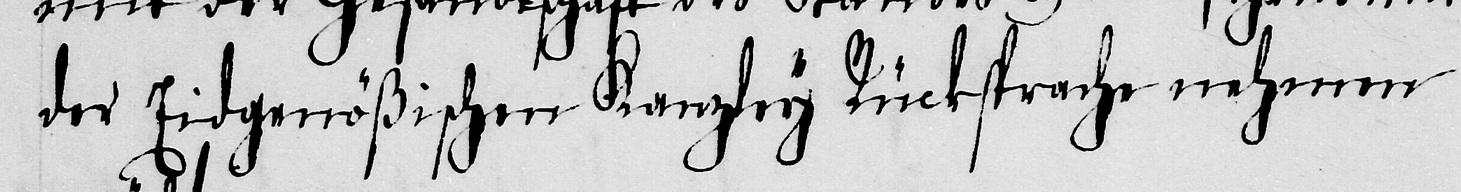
der Eidgenößischen Kanzley Rücksprache nehmen
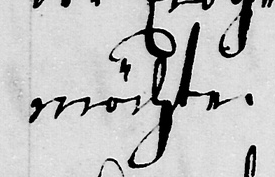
möchte.
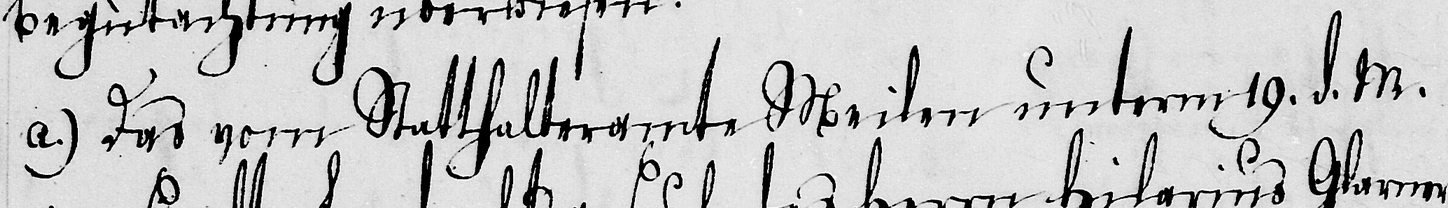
a.) Das vom Statthalteramte Meilen unterm 19. d. M.
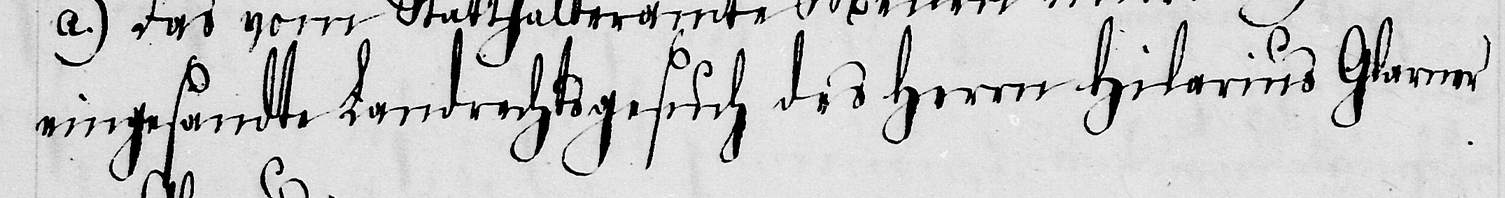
eingesandte Landrechtsgesuch des Herrn Hilarius Glarner
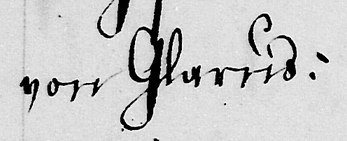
von Glarus.
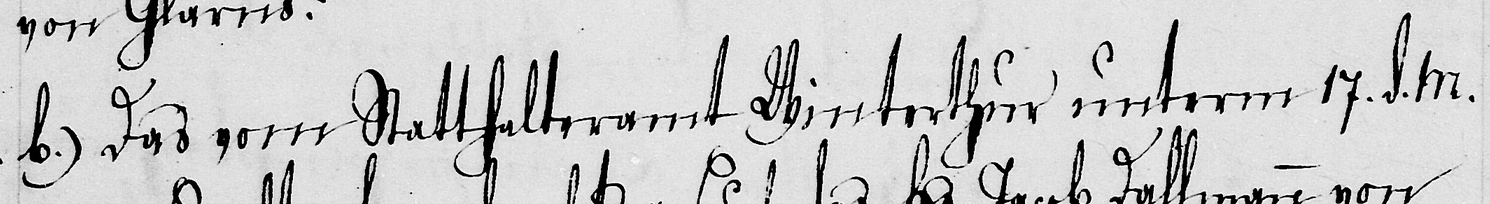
b.) Das vom Statthalteramt Winterthur unterm 17. d. M.
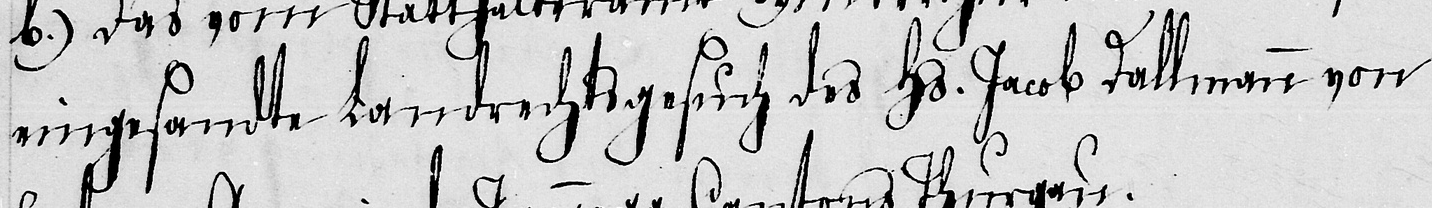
eingesandte Landrechtsgesuch des Hs. Jacob Dallmann von
